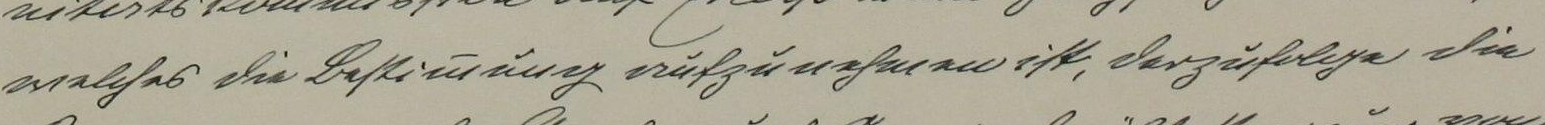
welches die Bestimmung aufzunehmen ist, derzufolge die
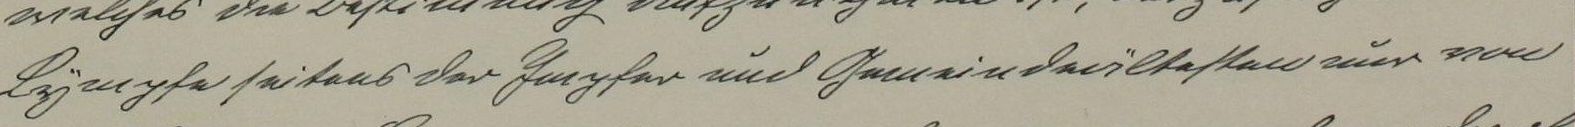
Lymphe seitens der Impfer und Gemeindeältesten nur von
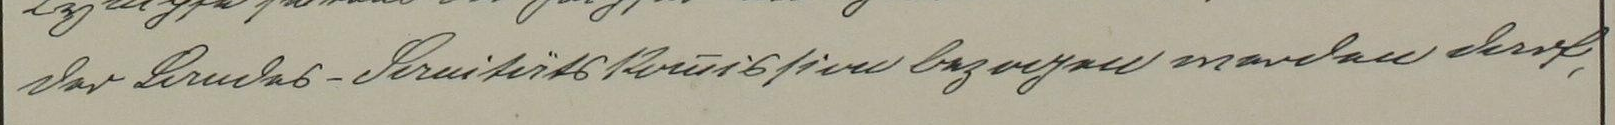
der Landes-Sanitätskommission bezogen werden darf,
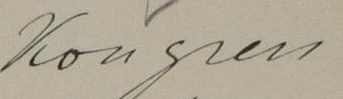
Kongress
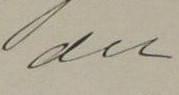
der
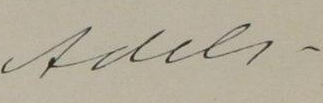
Adels-
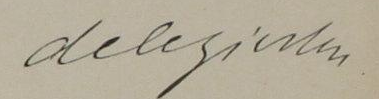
delegierten
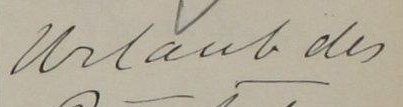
Urlaub des
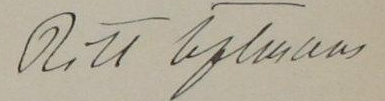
Ritt hptmans
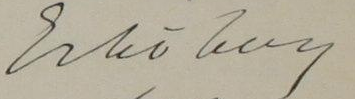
Erhöhung
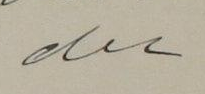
der
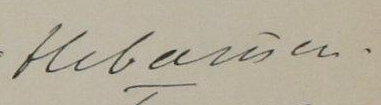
Hebammen-
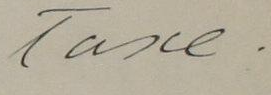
taxe
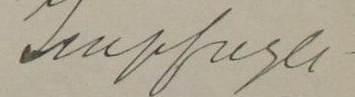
Impfregle-
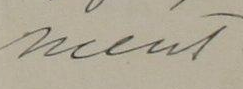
ment
